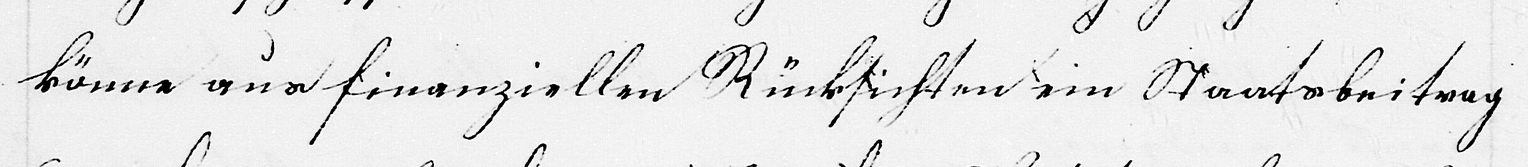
könne aus finanziellen Rücksichten ein Staatsbeitrag
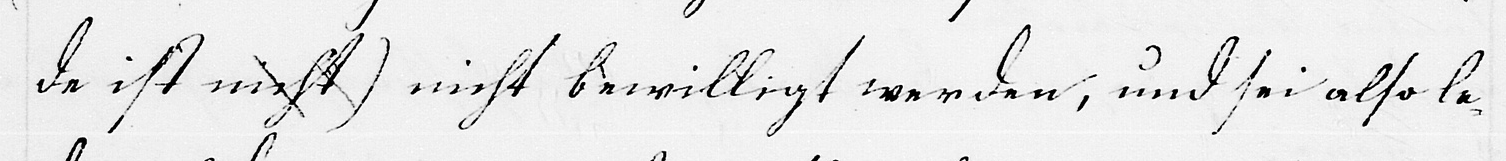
de ist a-nicht-a) nicht bewilligt werden, und sei also le¬
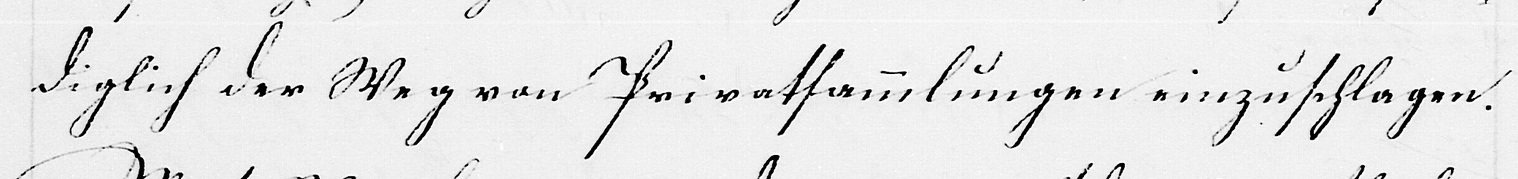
diglich der Weg von Privatsammlungen einzuschlagen.
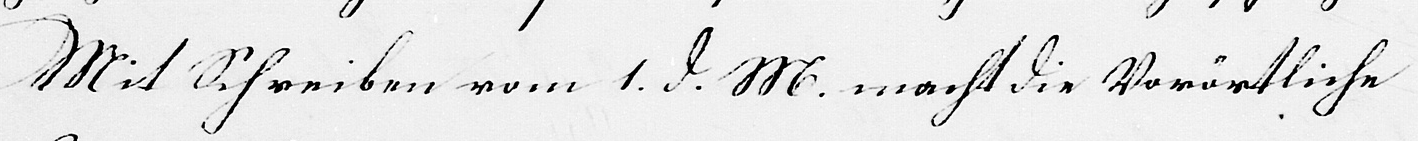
Mit Schreiben vom 1. d. M. macht die Vorörtliche
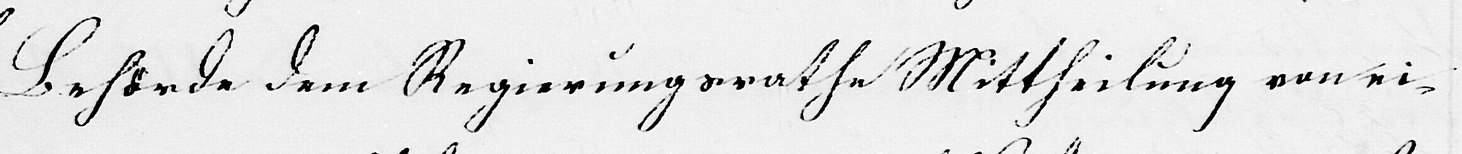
Behörde dem Regierungsrathe Mittheilung von ei¬
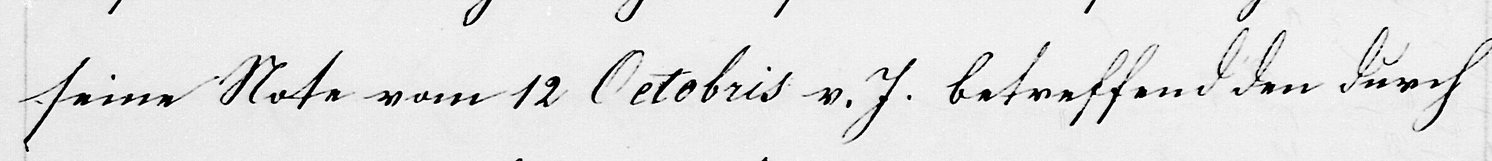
seine Note vom 12 Octobris v. J. betreffend den durch
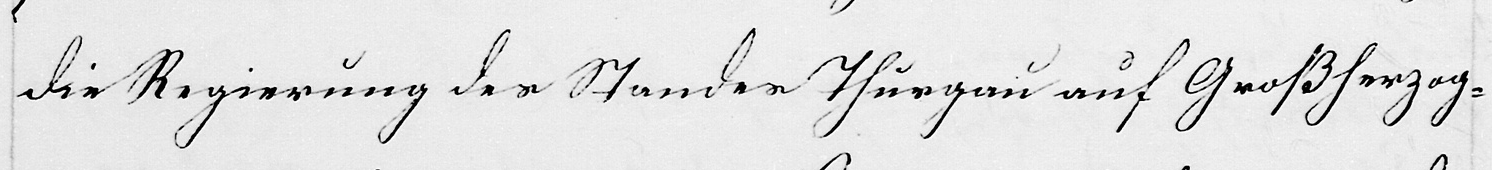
die Regierung des Standes Thurgau auf Großherzog¬
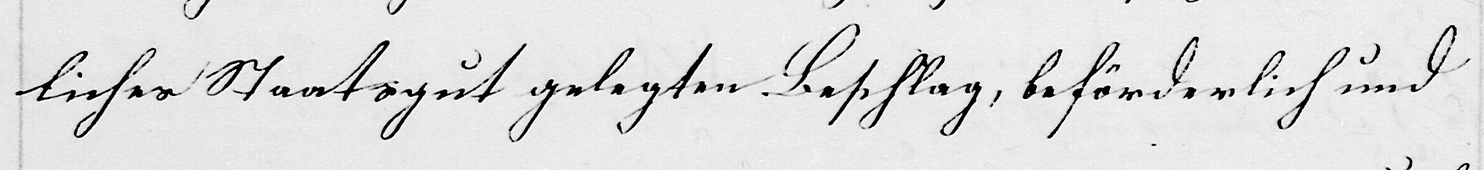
liches Staatsgut gelegten Beschlag, beförderlich und
